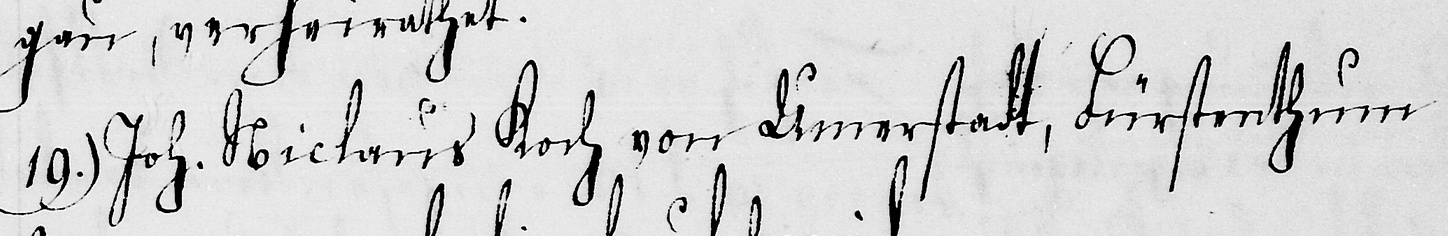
19.) Joh. Niclaus Koch von Umerstadt, Fürstenthum
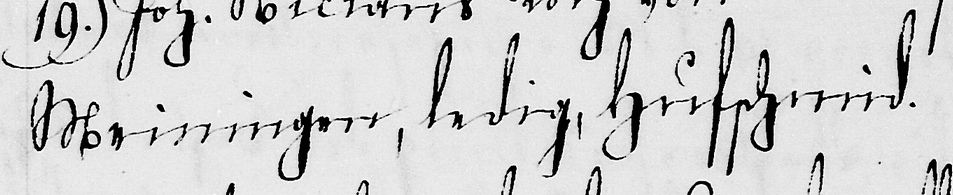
Meiningen, ledig, Hufschmid.
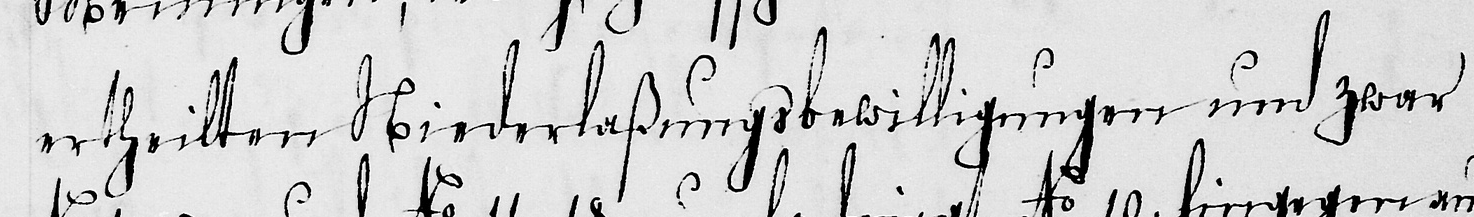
erhteilten Niederlassungsbewilligungen und zwar
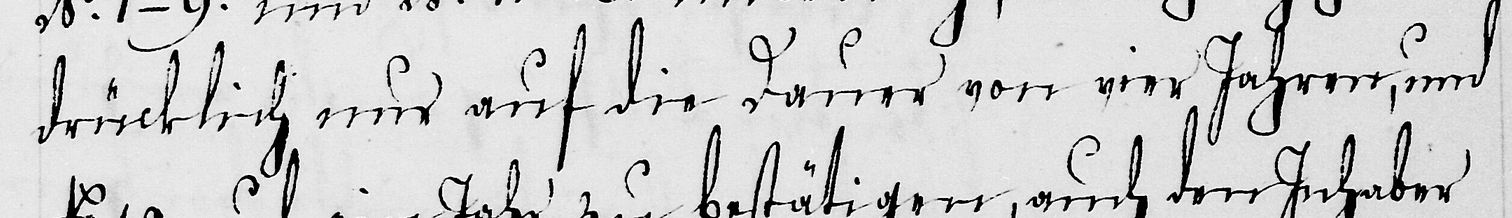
drücklich nur auf die Dauer von vier Jahren, und
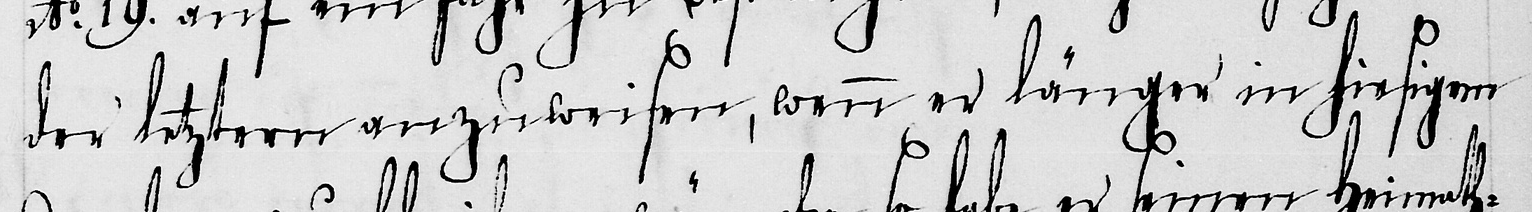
der letztern anzuweisen, wenn er länger in hiesigem
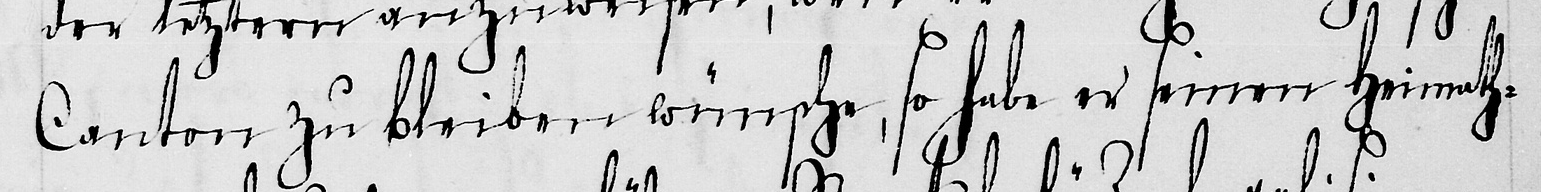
Canton zu bleiben wünsche, so habe er seinen Heimath¬
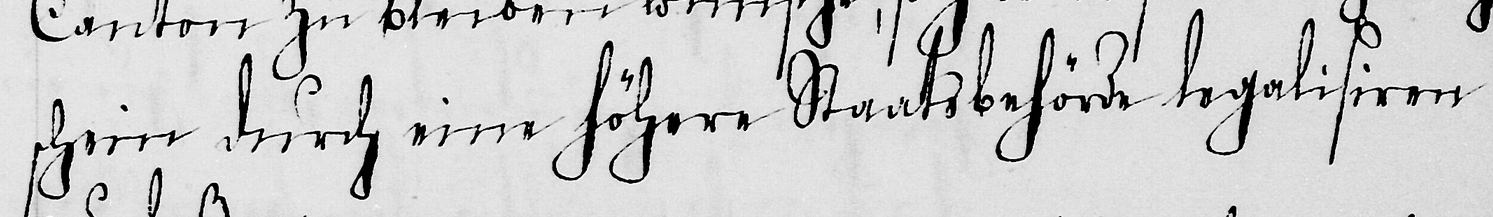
schein durch eine höhere Staatsbehörde legalisieren
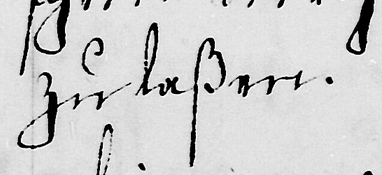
zu laßen.
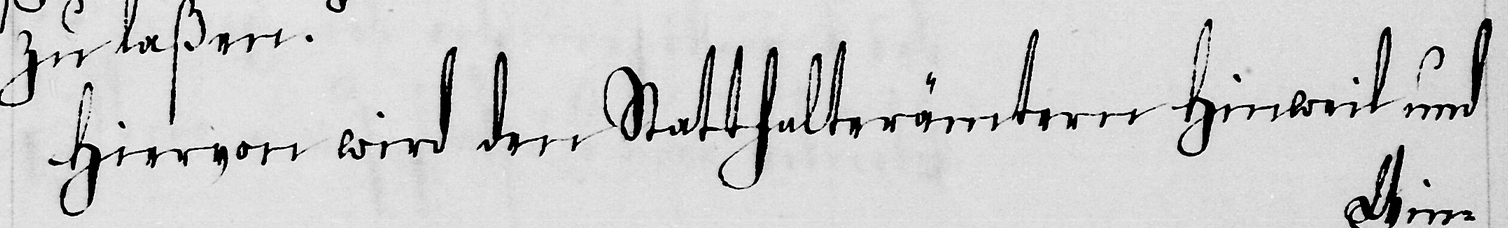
Hiervon wird den Statthalterämtern Hinweil und
